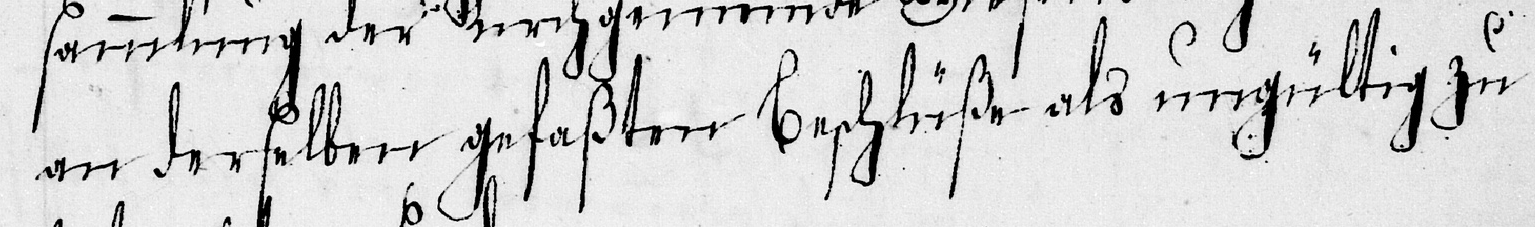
an derselben gefaßten Beschlüße als ungültig zu
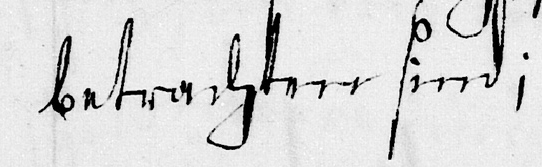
betrachten sind;
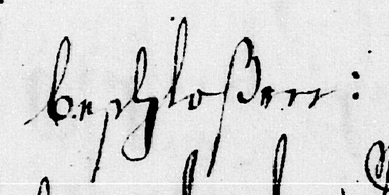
beschloßen:
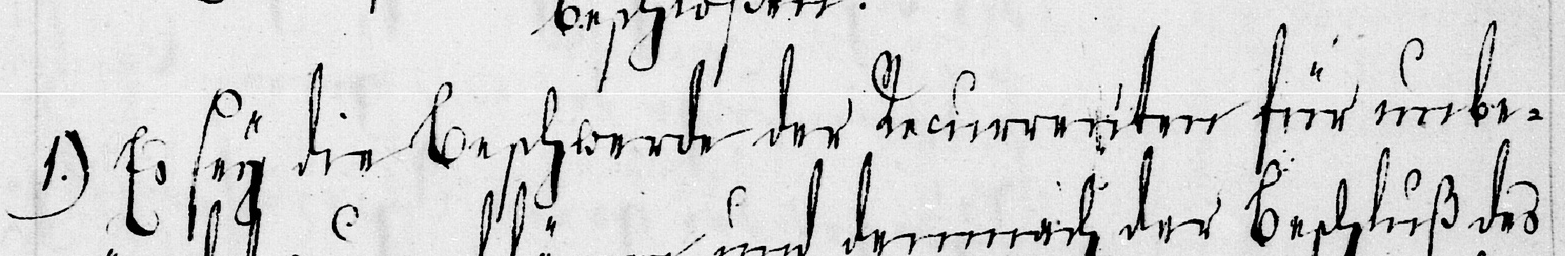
1.) Es sey die Beschwerde der Recurrenten für unbe¬
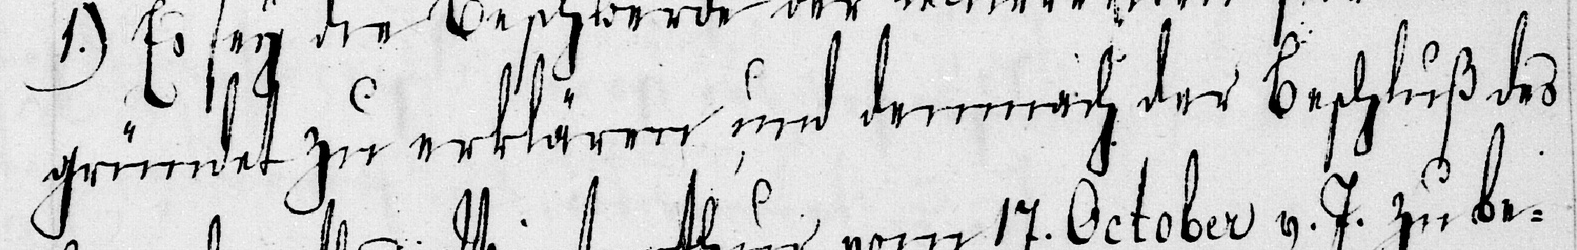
gründet zu erklären und demnach der Beschluß des
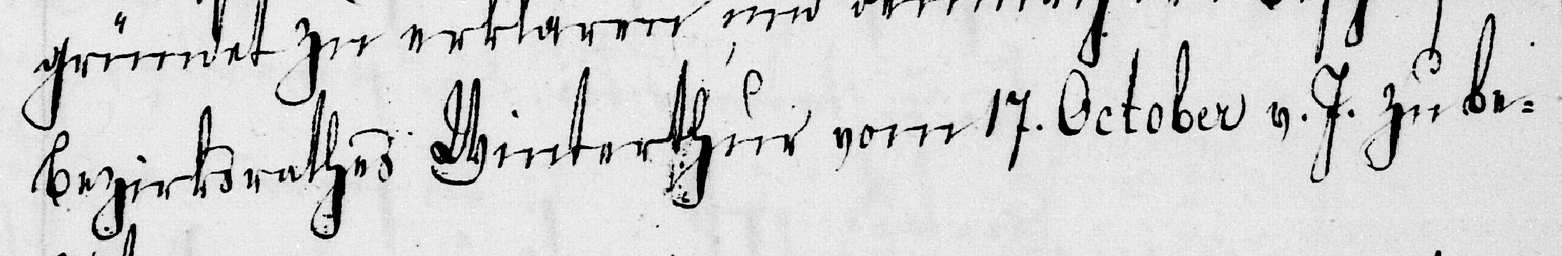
Bezirksrathes Winterthur vom 17. October v. J. zu be¬
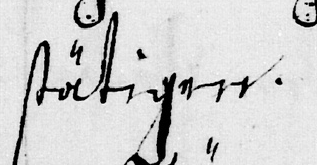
stätigen.
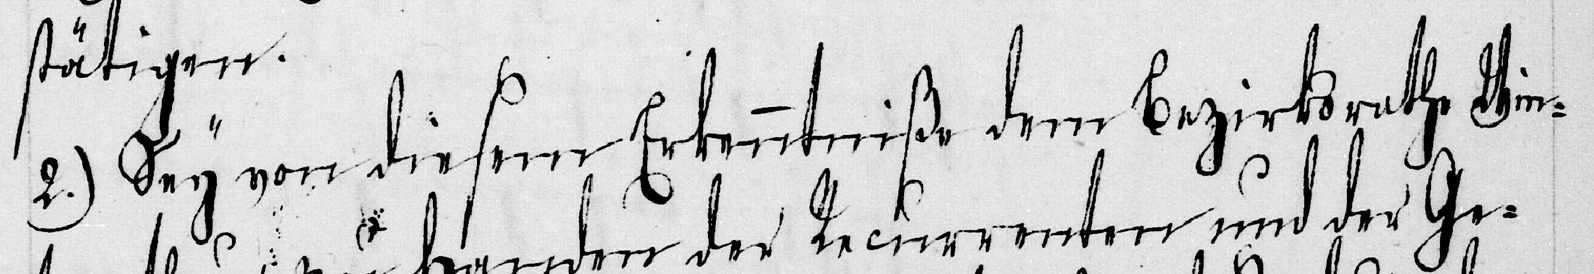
2.) Sey von diesem Erkenntniße dem Bezirksrathe Win¬
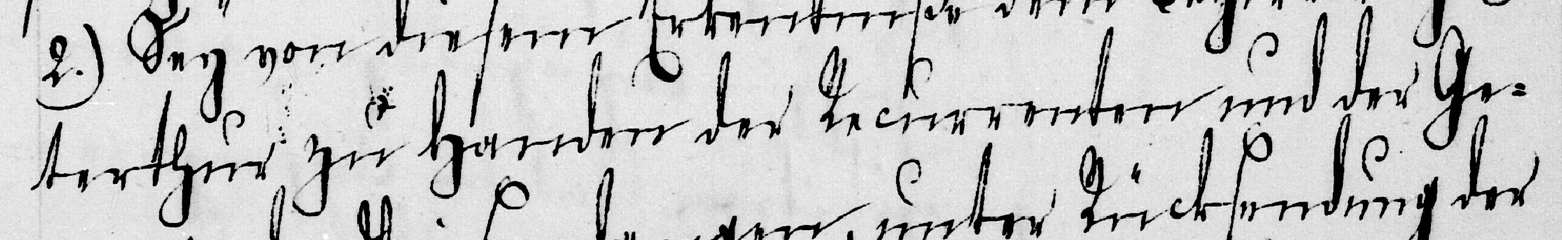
terthur zu Handen der Recurrenten und der Ge¬
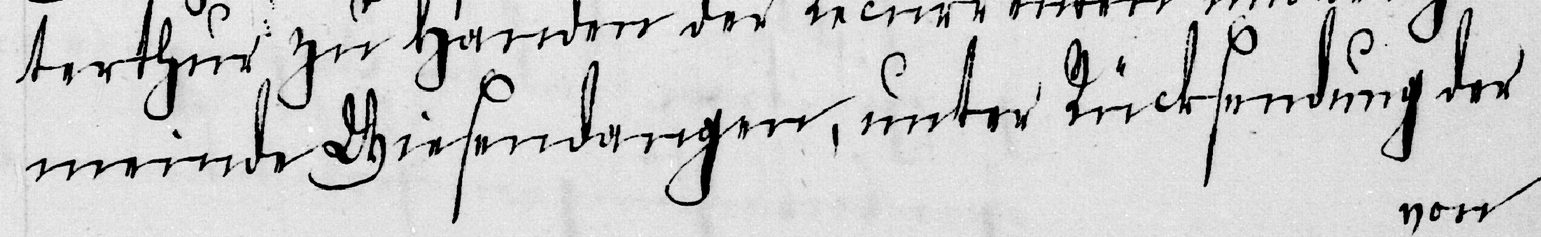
meinde Wiesendangen, unter Rücksendung der
